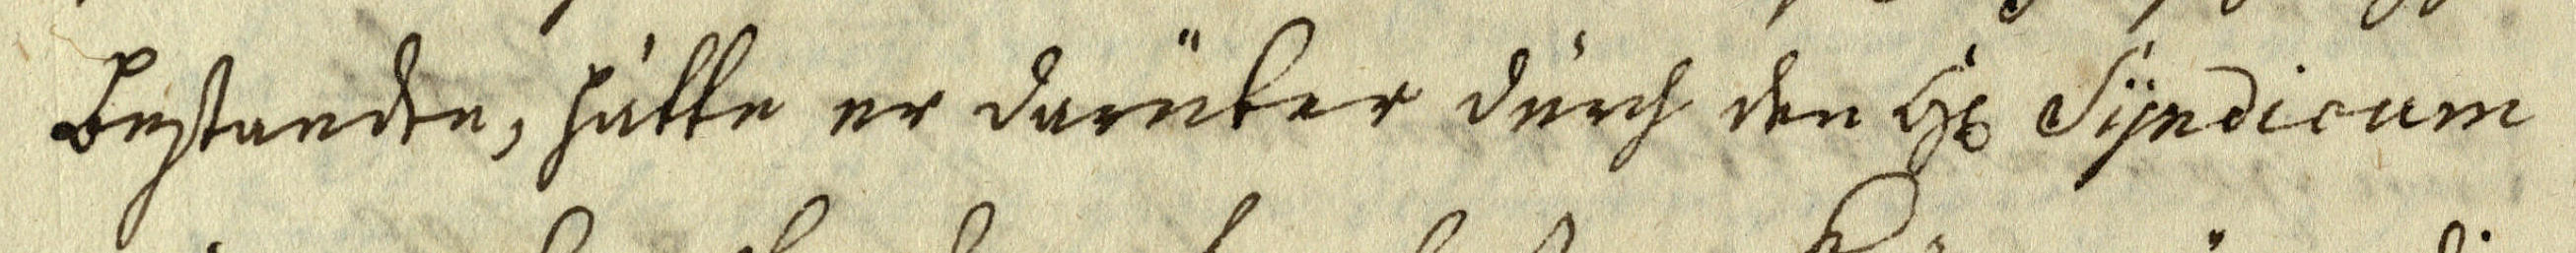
bestanden, hätte er darüber durch den H. Sÿndicum
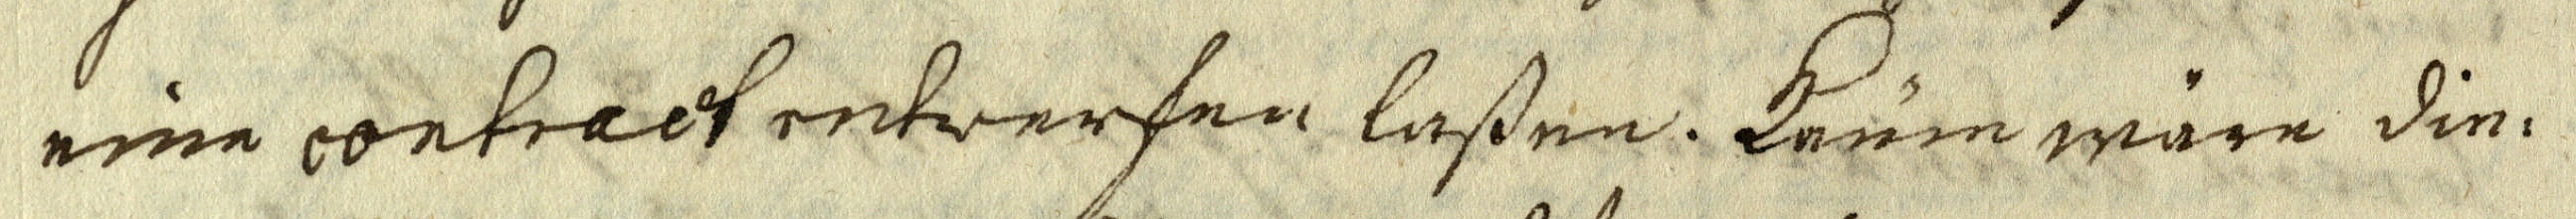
eine contract entwerfen laßen. Kaum wäre die¬
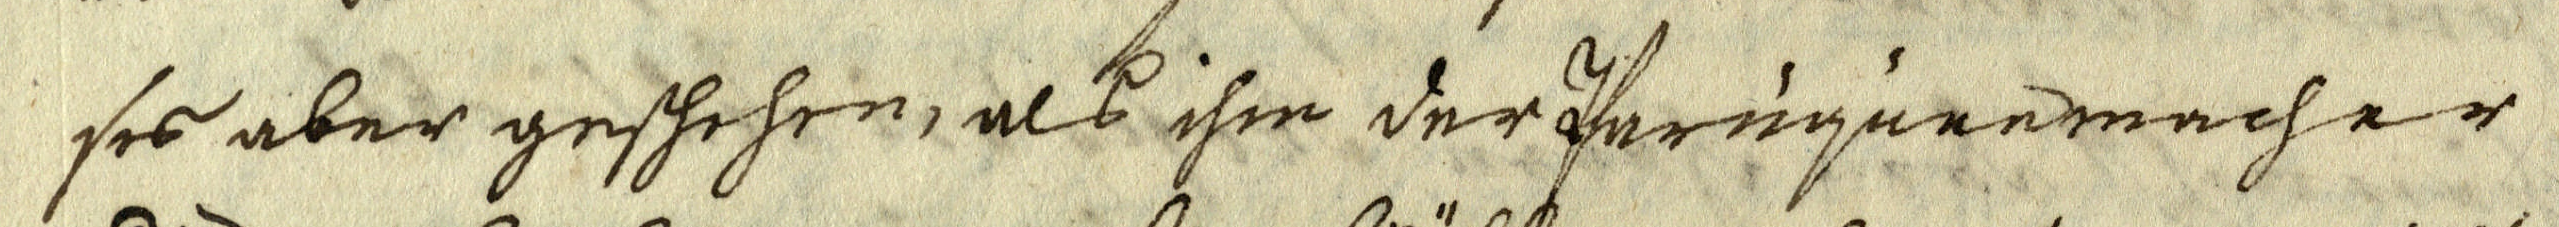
ses geschehen, als ihm der Paruquenmacher
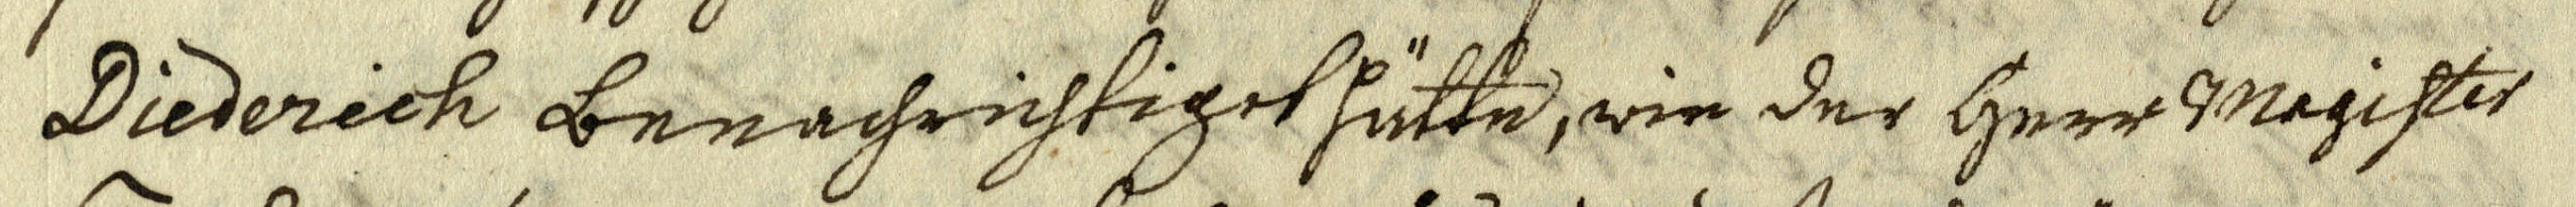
Diederich benachrichtiget hätte, wie der Herr Magister
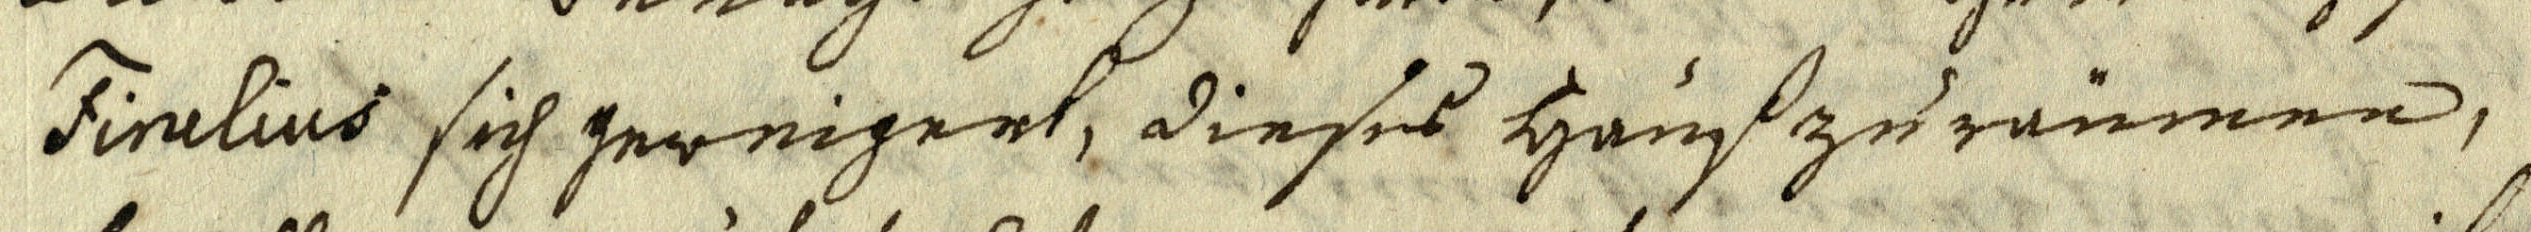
Finelius sich geweigert, dieses Hauß zu räumen,
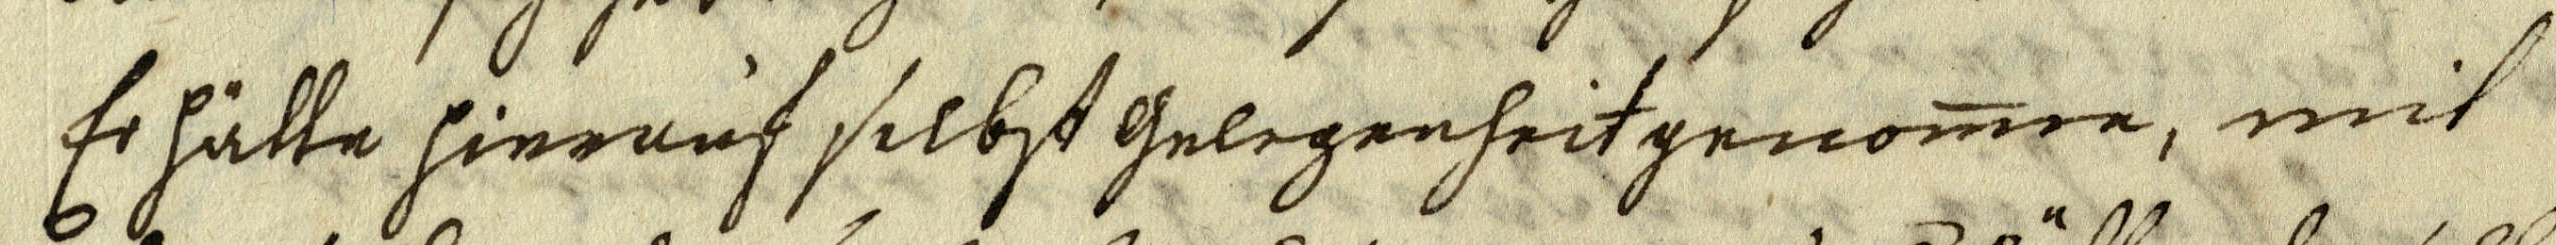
Er hätte hierauf selbst Gelegenheit genomen, mit
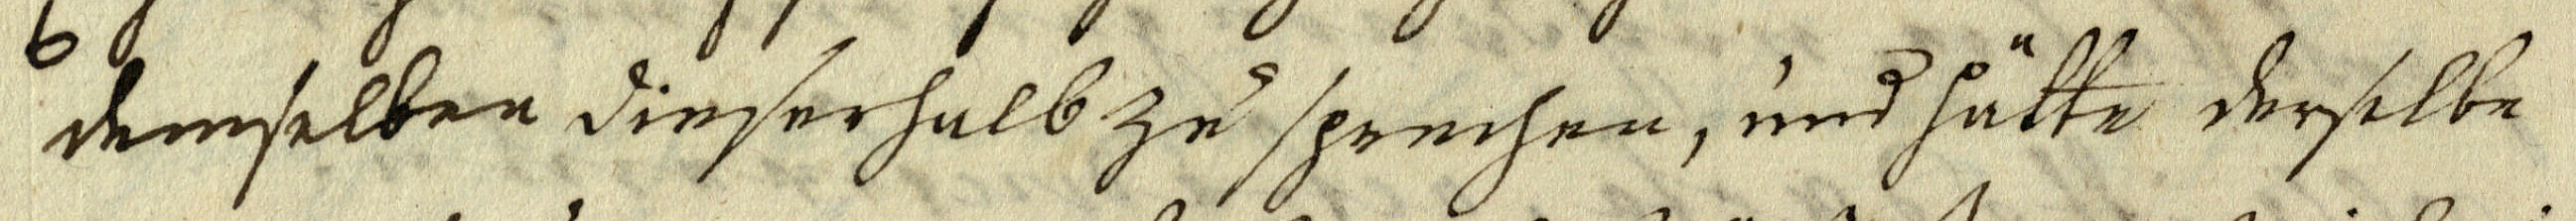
demselben dieserhalb zu sprechen, und hätte derselbe
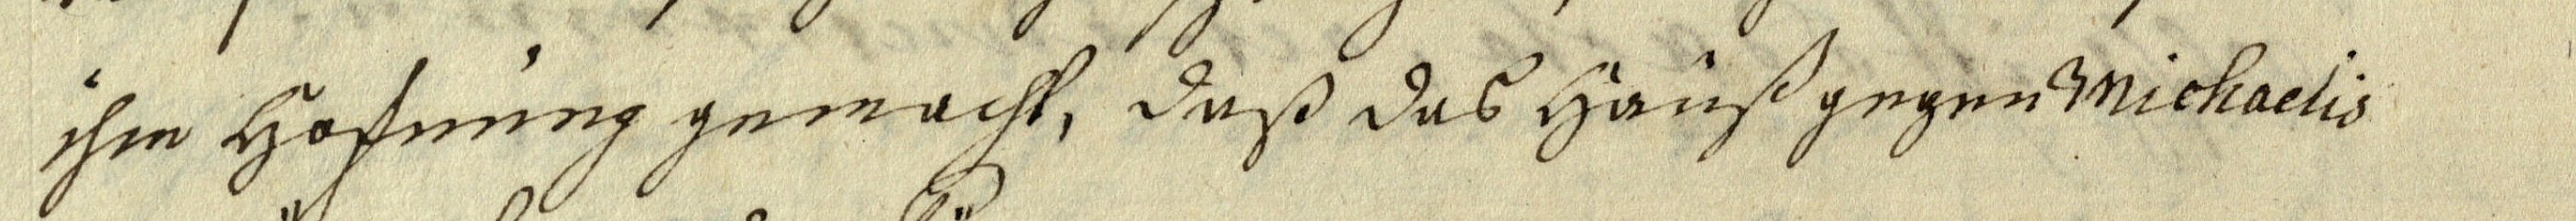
ihm Hofnung gemacht, daß das Hauß gegen Michaelis
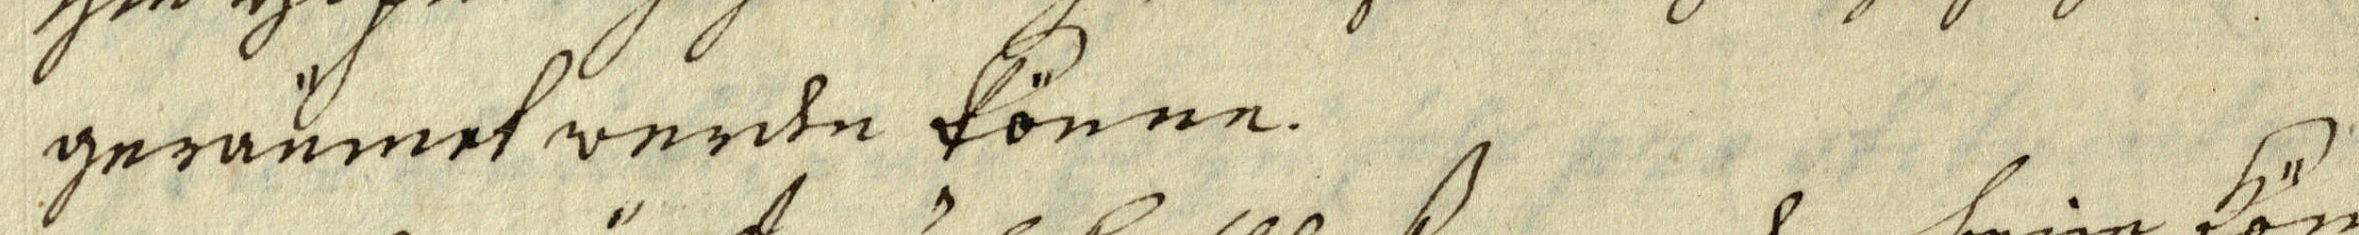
geräumet werden könne.
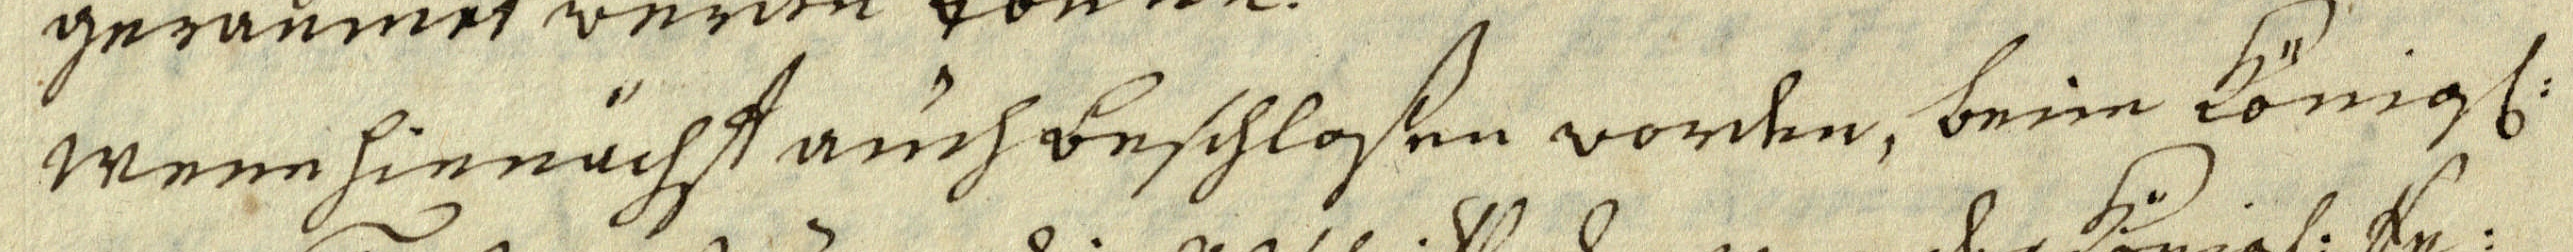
Wenn hienächst auch beschlossen worden, beim Königl.
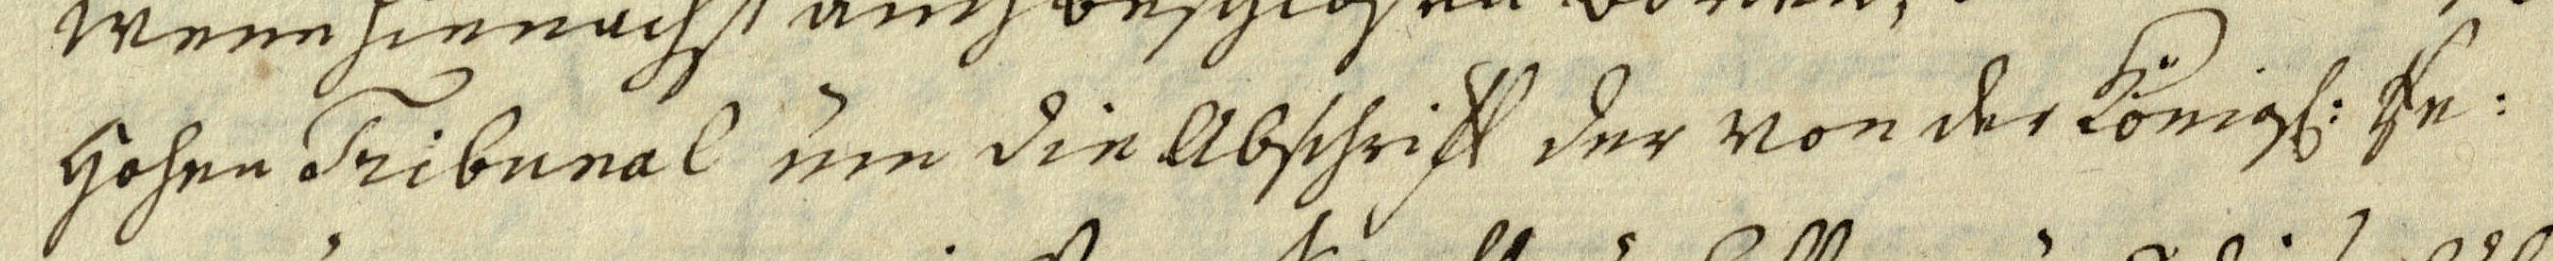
Hohen Tribunalum die Abschrift der von der Königl. Re¬
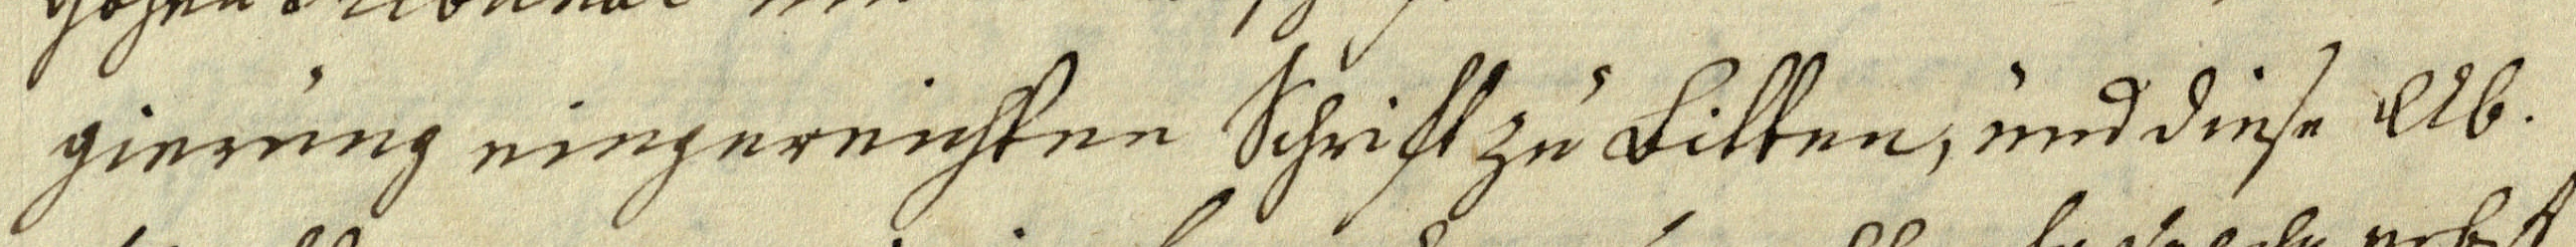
gierung eingereichten Schrift zu bitten, und diese Ab¬
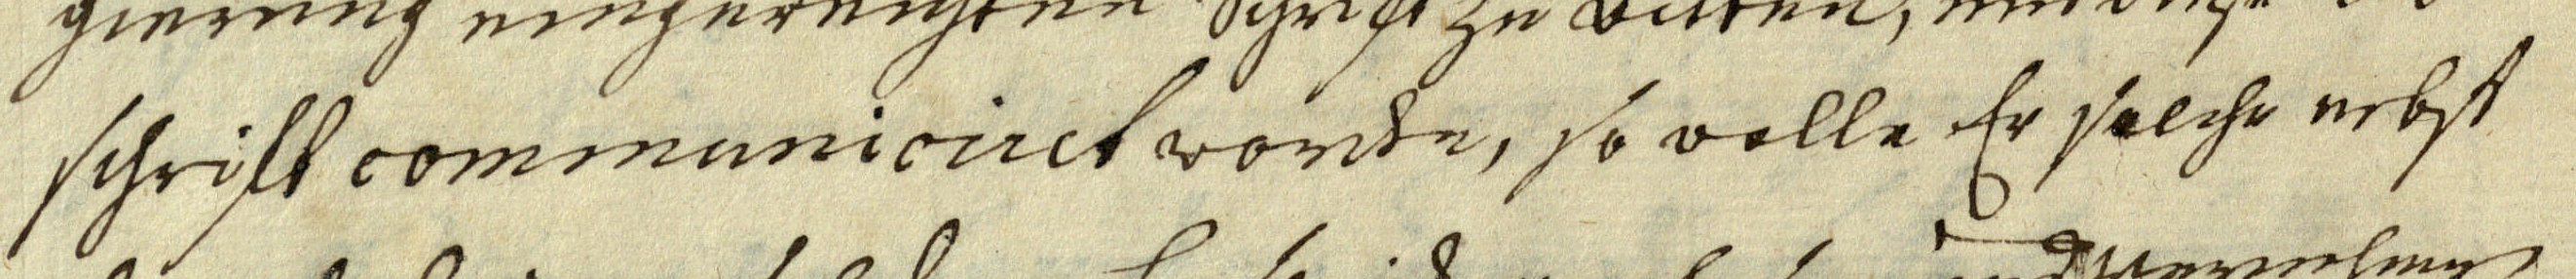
schrift communiciret worden, so wolle Er solche nebst
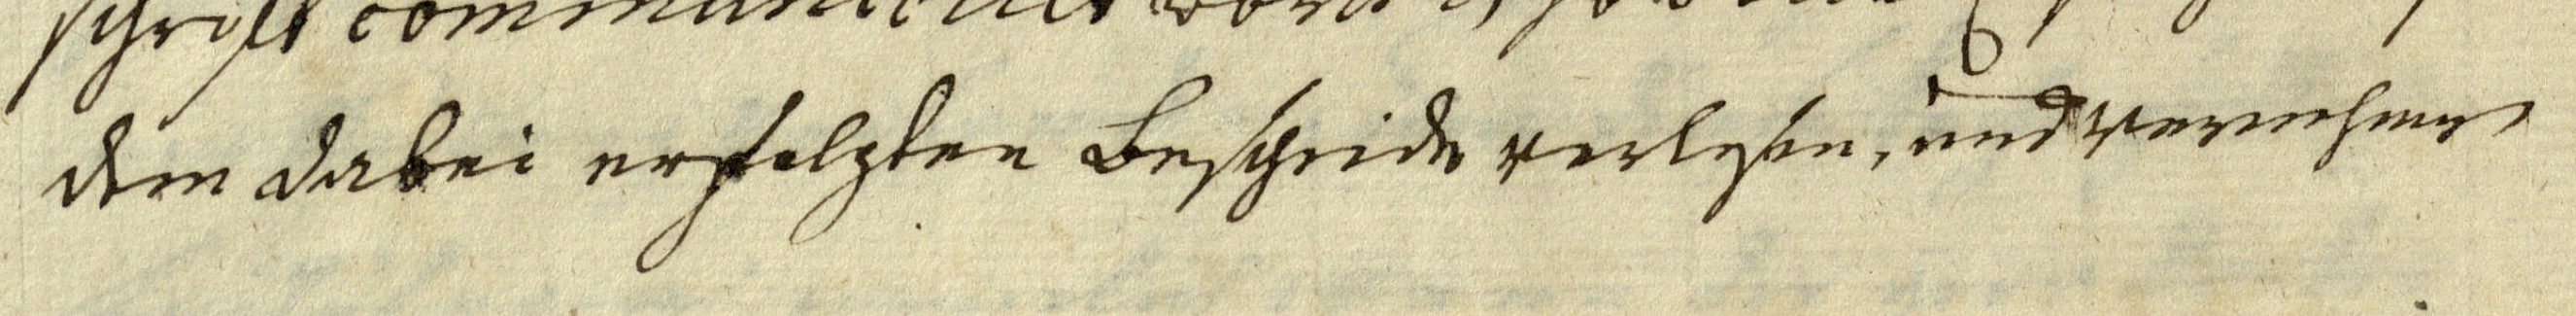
dem dabei erfolgten Bescheide verlesen, und vernehmen
